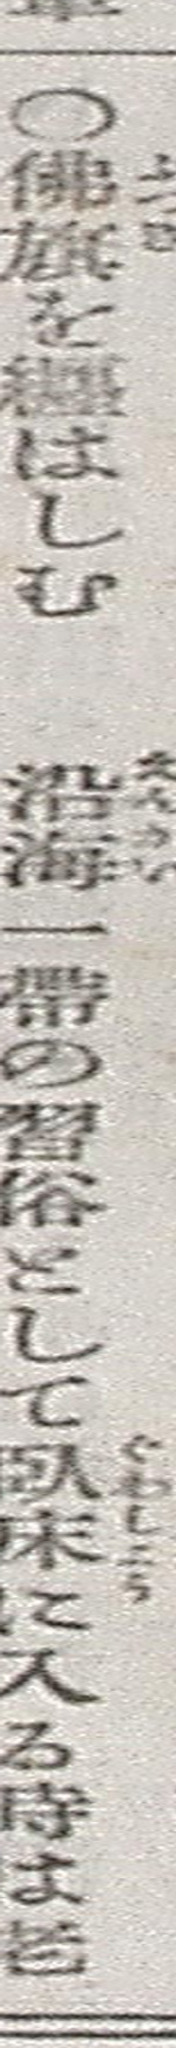○佛旗を纏はしむ沿海一帯の習俗として臥床に入る時は老
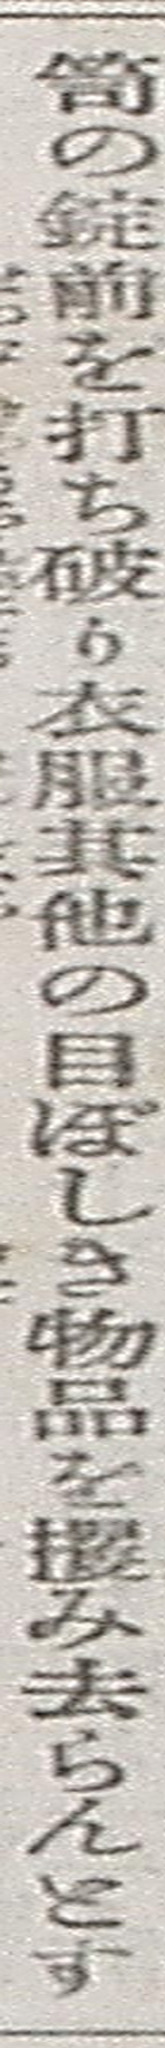笥の錠前を打ち破り衣服其他の目ぼしき物品を攫み去らんとす
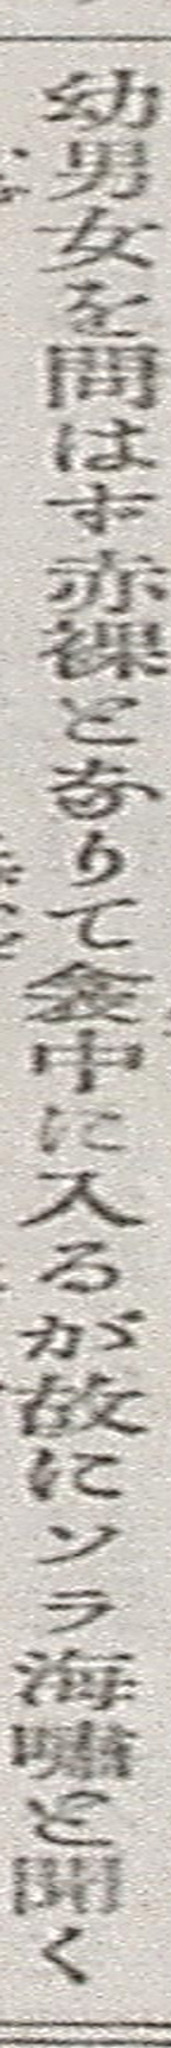幼男女を問はず赤裸となりて衾中に入るが故にソラ海嘯と聞く
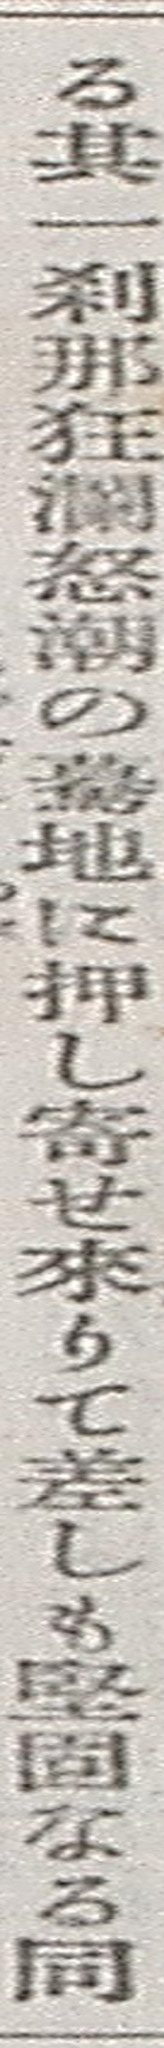る其一刹那狂瀾怒潮の驀地に押し寄せ来りて差しも堅固なる同
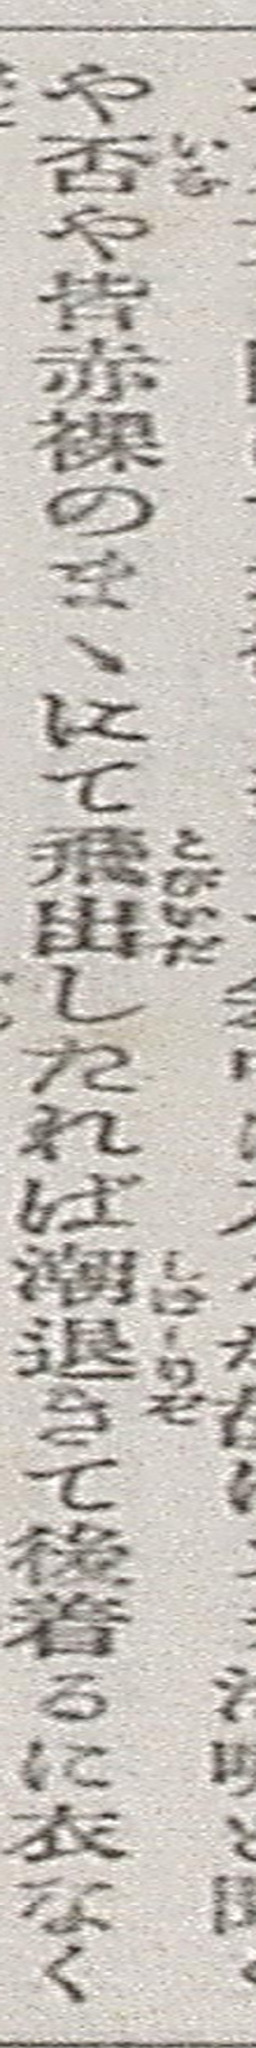や否や皆赤裸のまゝにて飛出したれば潮退きて後着るに衣なく
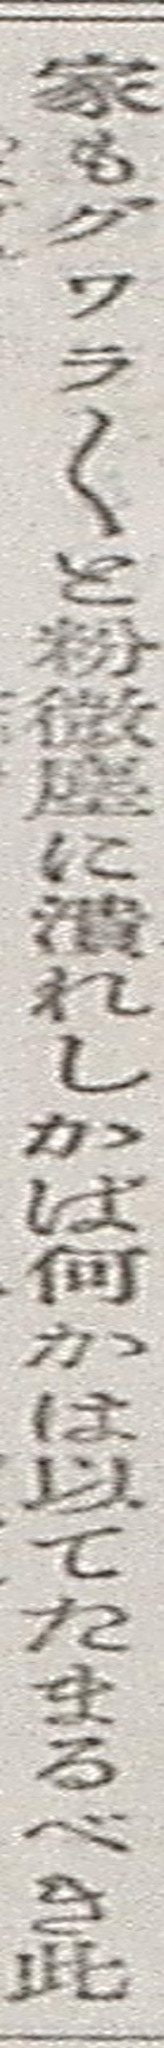家もグワラ〳〵と粉微塵に潰れしかば何かは以てたまるべき此
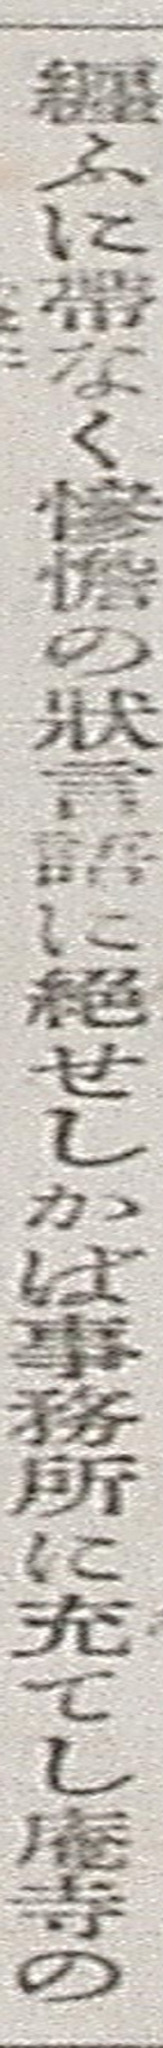纏ふに帯なく惨憺の状言語に絶せしかば事務所に充てし庵寺の
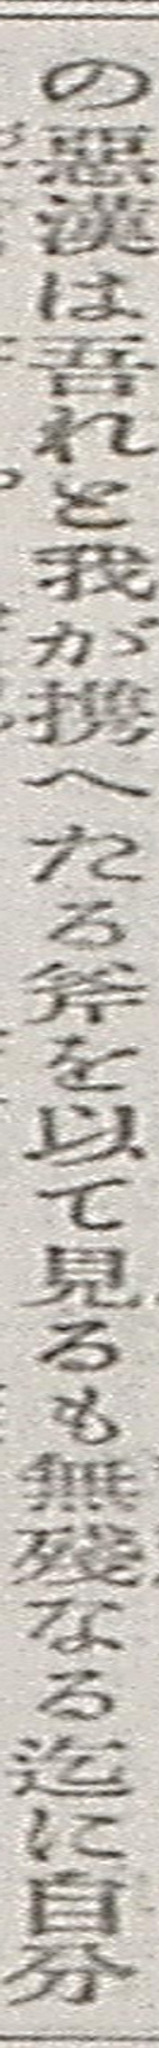の悪漢は吾れと我が携へたる斧を以て見るも無残なる迄に自分
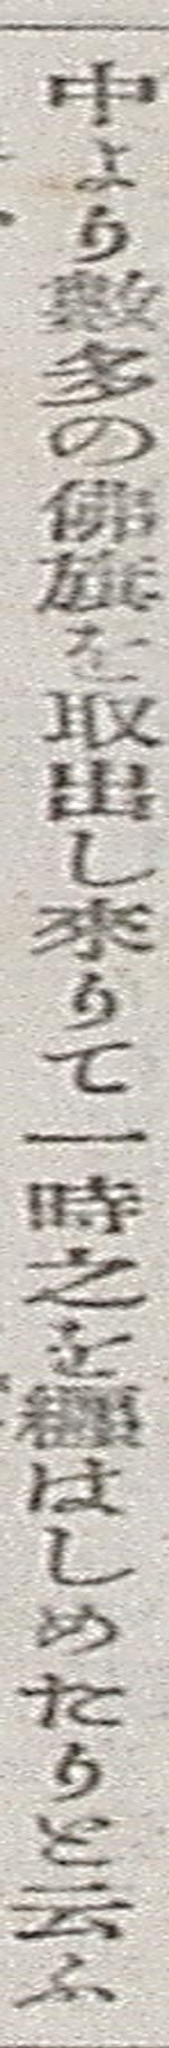中より数多の佛旗を取出し来りて一時之を纏はしめたりと云ふ
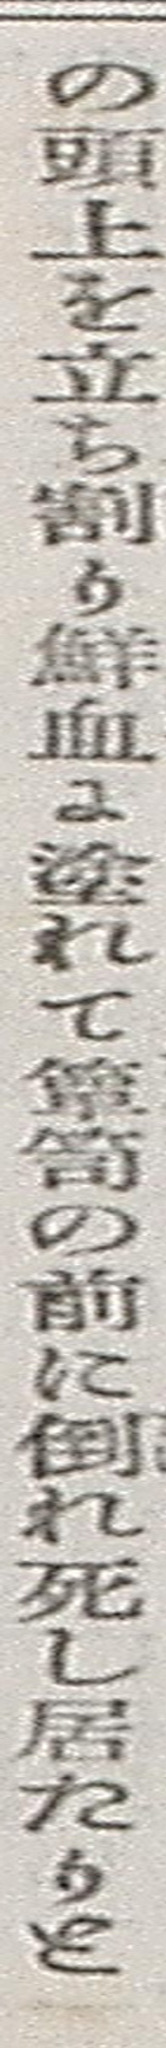の頭上を立ち割り鮮血に塗れて箪笥の前に倒れ死し居たりと
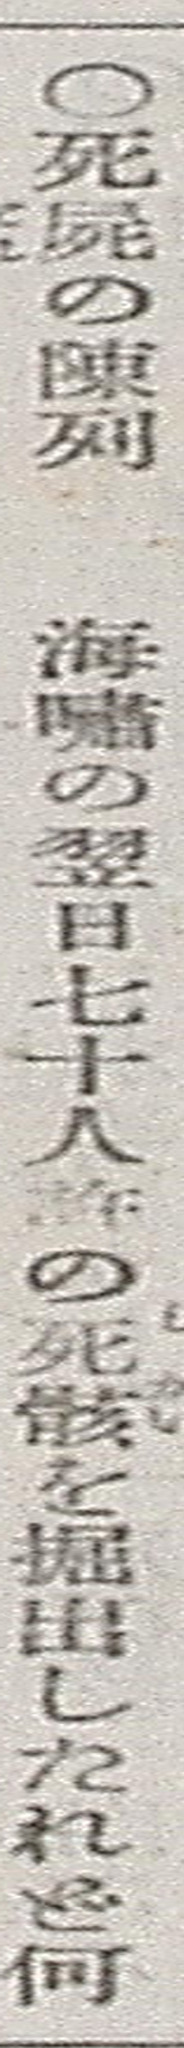○死屍の陳列海嘯の翌日七十人許の死骸を堀出したれど何
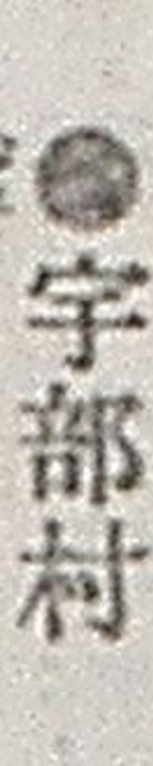●宇部村
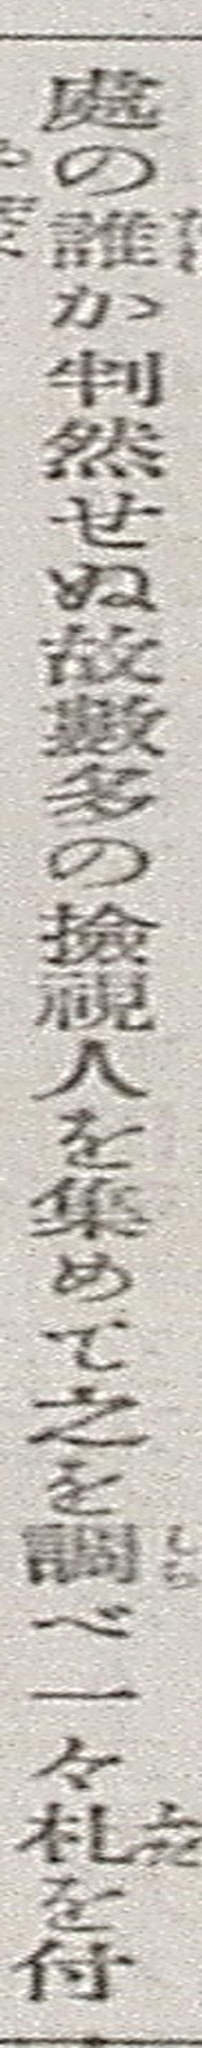処の誰か判然せぬ故数多の検視人を集めて之を調べ一々札を付
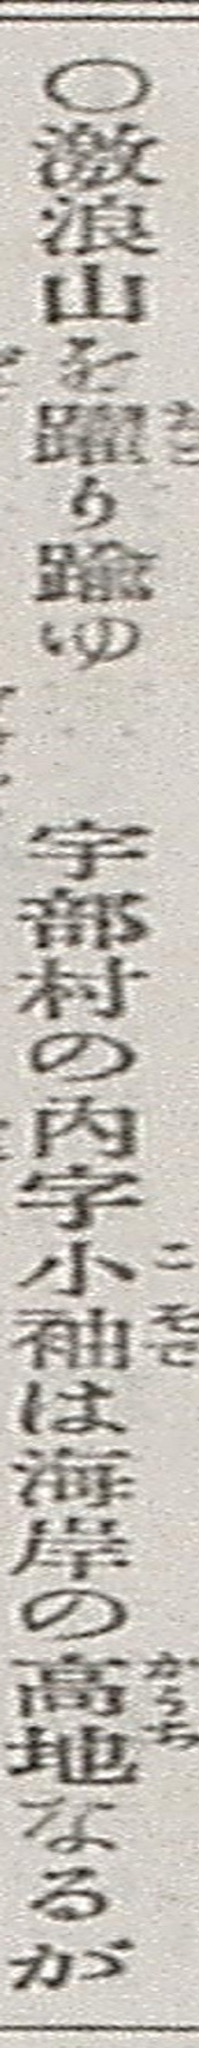○激浪山を躍り踰ゆ宇部村の内字小袖は海岸の高地なるが
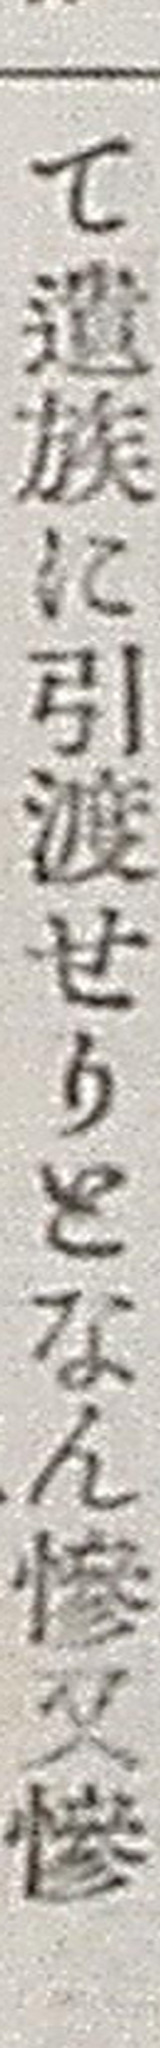て遺族に引渡せりとなん惨又惨
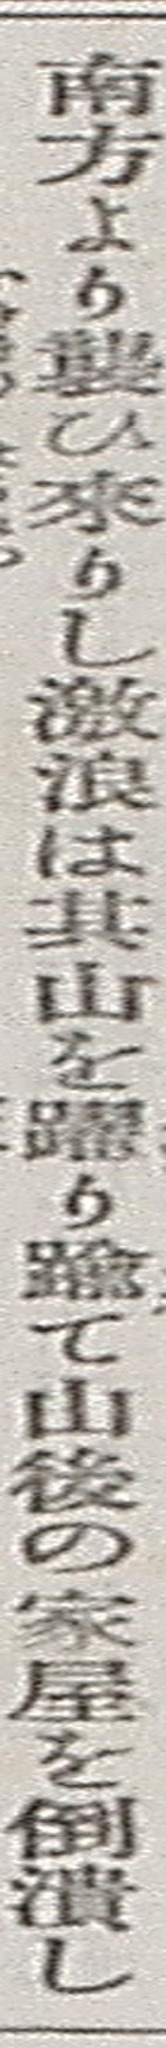南方より襲ひ来りし激浪は其山を躍り踰て山後の家屋を倒潰し
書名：風俗畫報臨時増刊第百二十號　大海嘯被害録（下）
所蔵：東京大学地震研究所図書室 Earthquake Research Institute Library, The University of Tokyo, JAPAN
